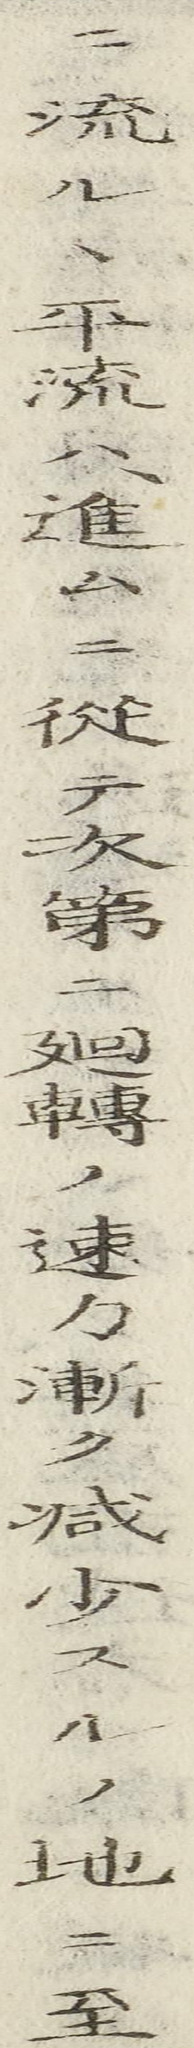ニ流ルヽ平流ハ、進ムニ従テ次第ニ廻転ノ速力漸ク減少スルノ地ニ至
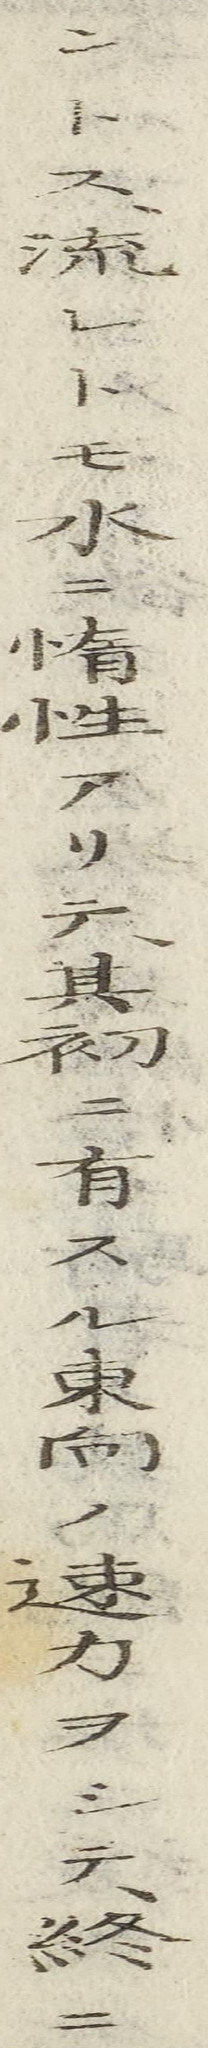ントス、流レトモ水ニ惰性アリテ、其初ニ有スル東向ノ速力ヲシテ、終ニ

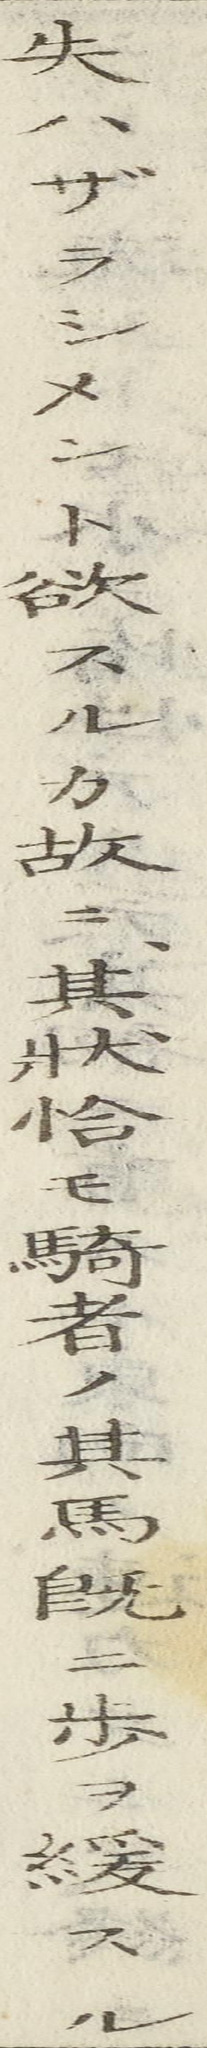失ハザラシメント欲スルカ故ニ、其状适モ騎者ノ其馬既ニ歩ヲ緩スル
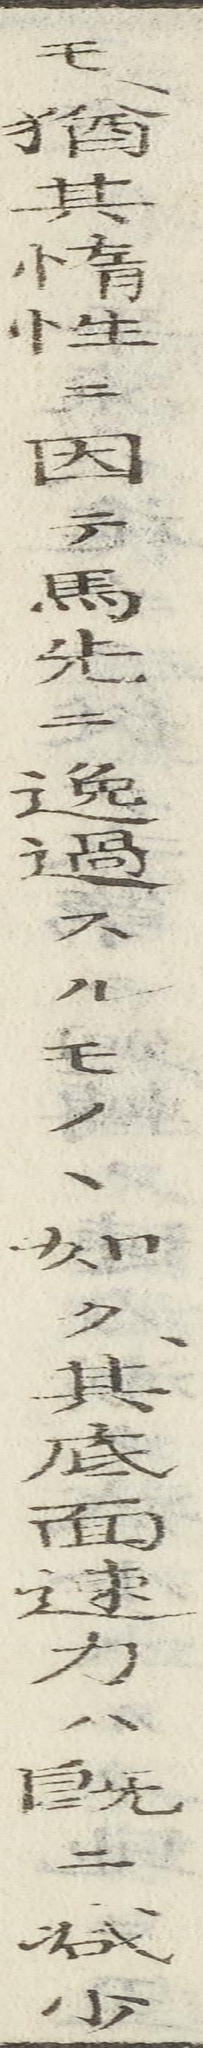モ、猶其惰性ニ因テ馬先ニ逸過スルモノヽ如ク、其底面速力ハ既ニ減少
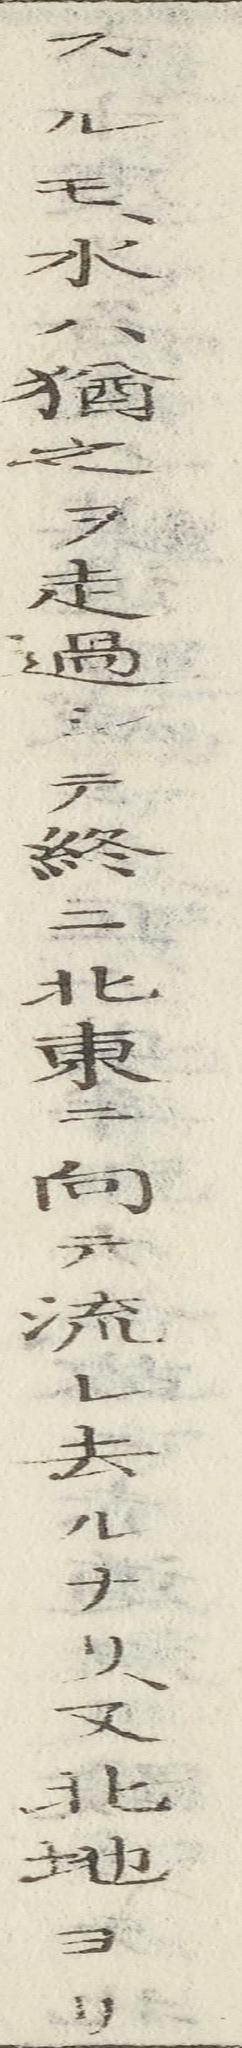スルモ、水ハ猶之ヲ走過シテ終ニ北東ニ向テ流レ去ルナリ、又北地ヨリ
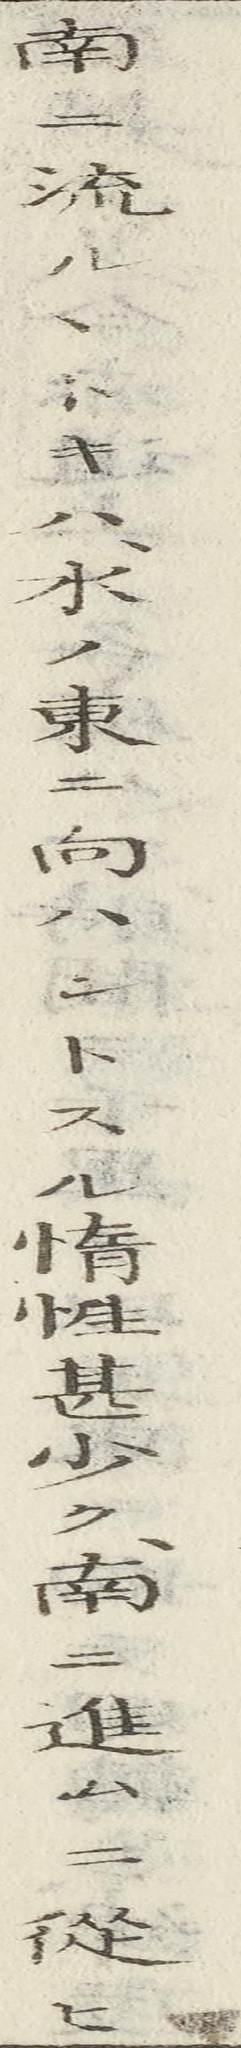南ニ流ルヽトキハ、水ノ東ニ向ハントスル惰性甚少ク、南ニ進ムニ従ヒ
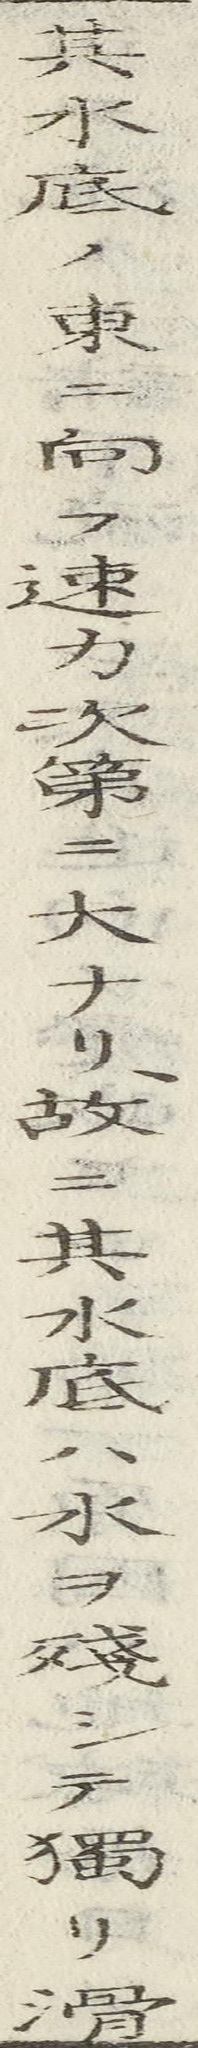其水底ノ東ニ向フ速力次第ニ大ナリ、故ニ其水底ハ水ヲ残シテ独リ滑
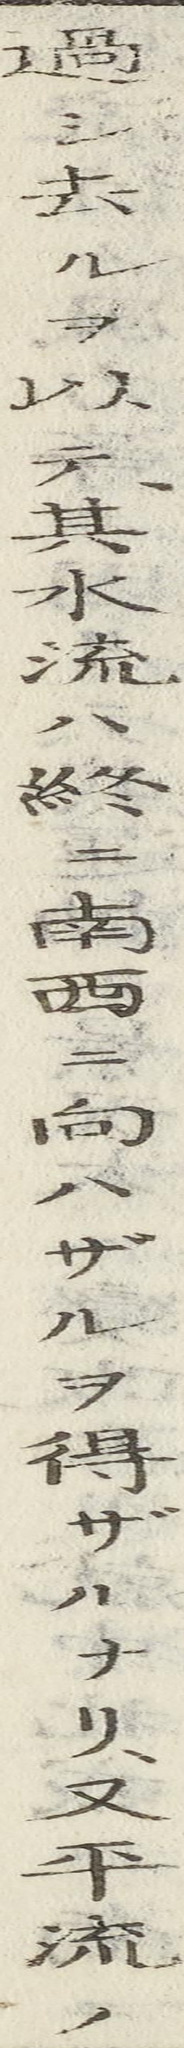過シ去ルヲ以テ、其水流ハ終ニ南西ニ向ハザルヲ得ザルナリ、又平流ノ
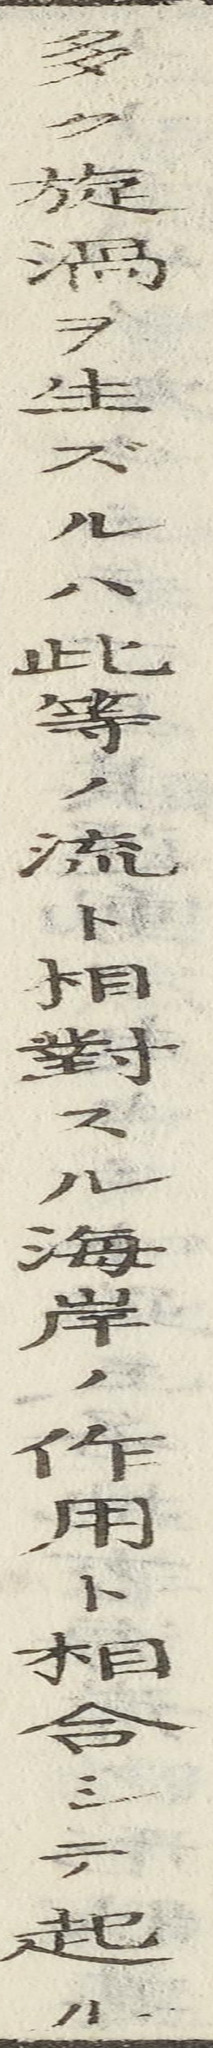多ク旋渦ヲ生ズルハ此等ノ流ト相対スル海岸ノ作用ト相合シテ起ル
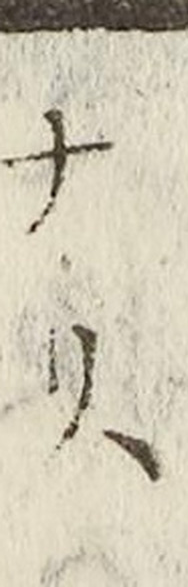ナリ、
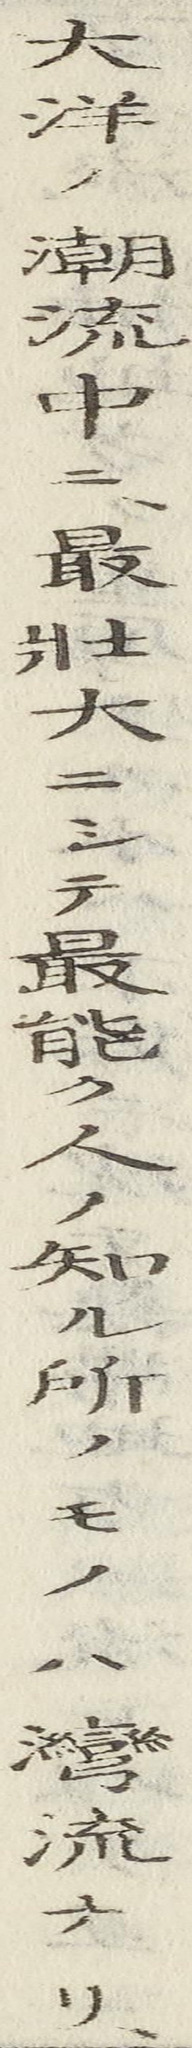大洋ノ潮流中ニ、最壮大ニシテ最能ク人ノ知ル所ノモノハ湾流ナリ、
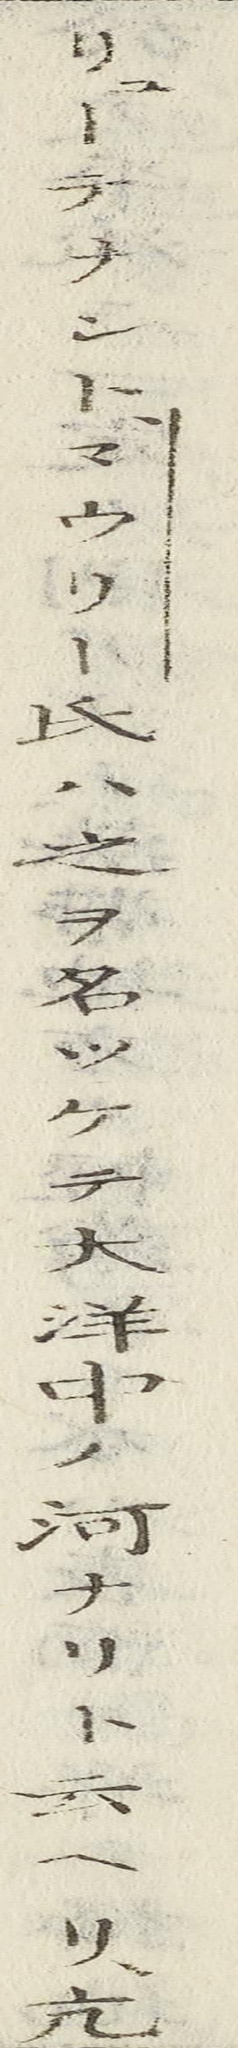リューテナント、マウリー氏ハ之ヲ名ツケテ大洋中ノ河ナリト云ヘリ、亢
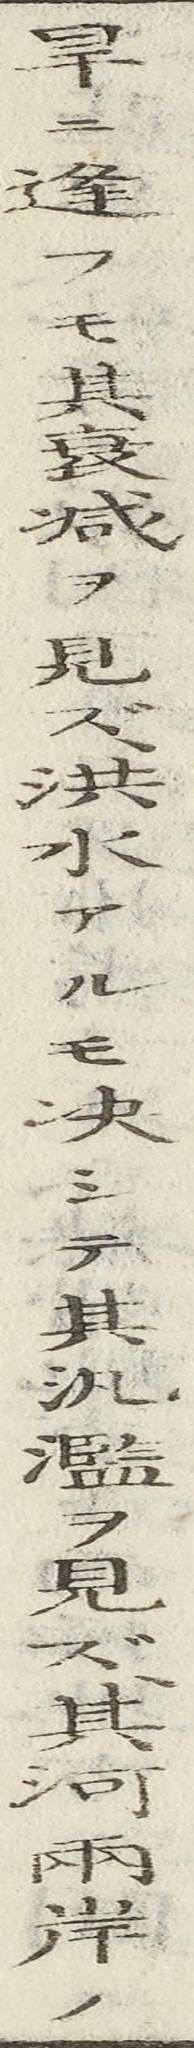旱ニ逢フモ其衰減ヲ見ズ、洪水アルモ決シテ其汎濫ヲ見ズ、其河両岸ノ
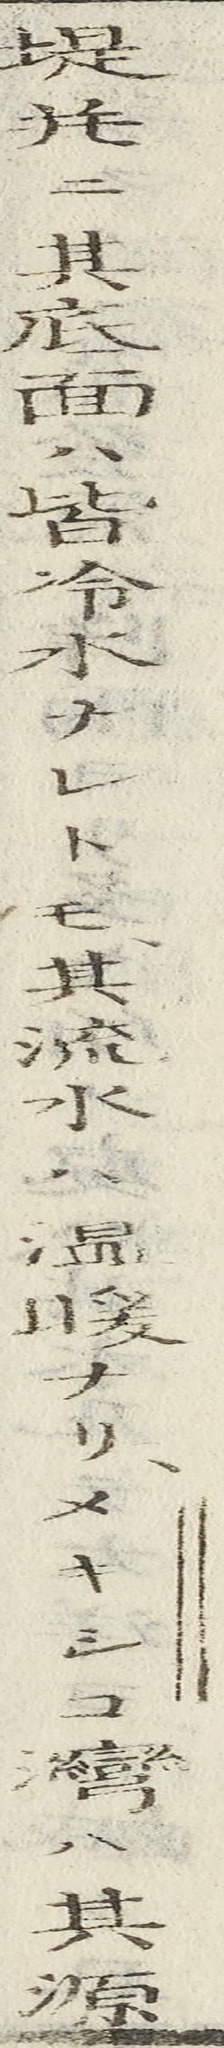堤共ニ其底面ハ皆冷水ナレトモ、其流水ハ温暖ナリ、メキシコ湾ハ其源
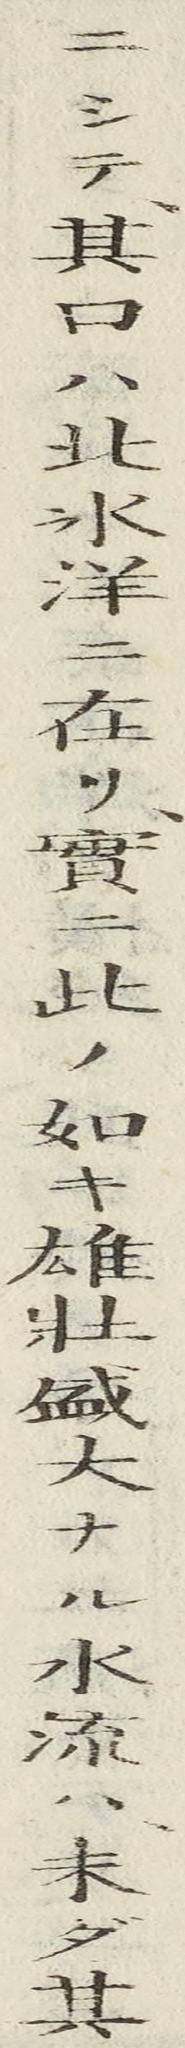ニシテ、其口ハ北氷洋ニ在リ、実ニ此ノ如キ雄壮盛大ナル水流ハ、未ダ其
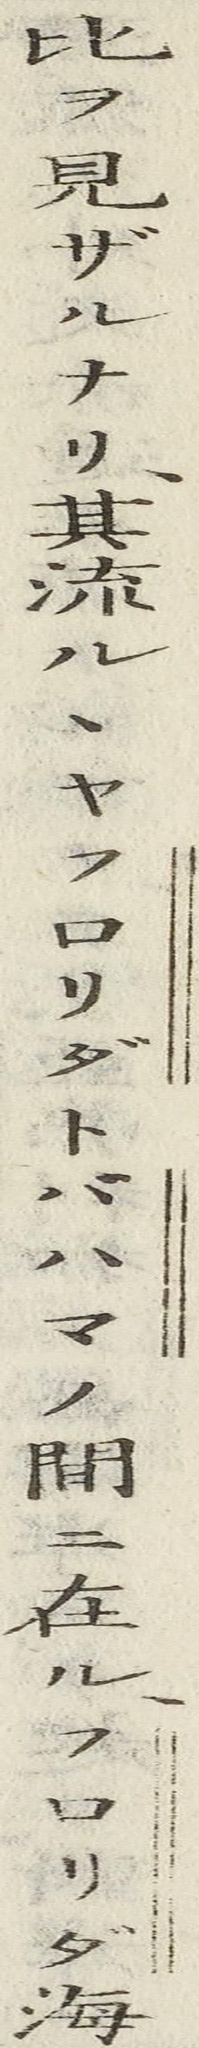比ヲ見ザルナリ、其流ルヽヤフロリダトバハマノ間ニ在ル、フロリダ海
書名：百科全書　地文學　全
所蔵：東京大学地震研究所図書室 Earthquake Research Institute Library, The University of Tokyo, JAPAN
